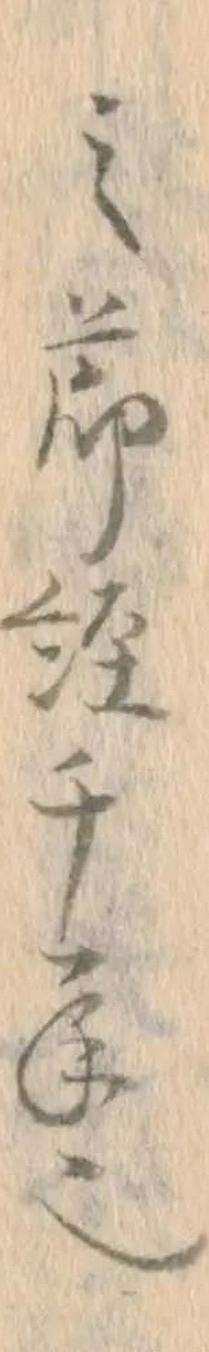之節経千承也
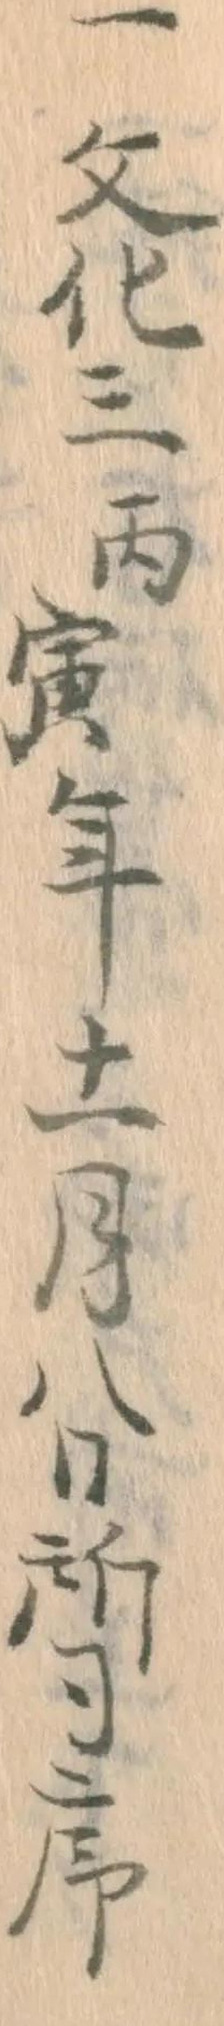一文化三丙寅年十一月八日所司序
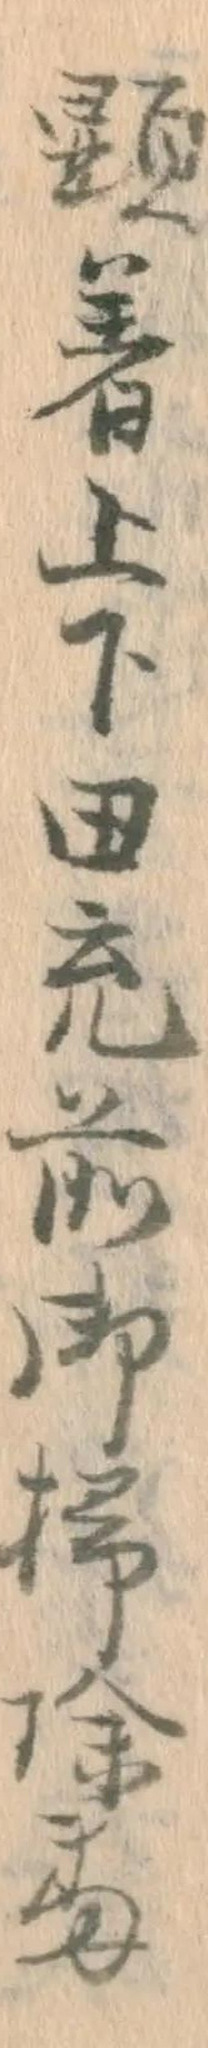顕着上下田充前御掃除番
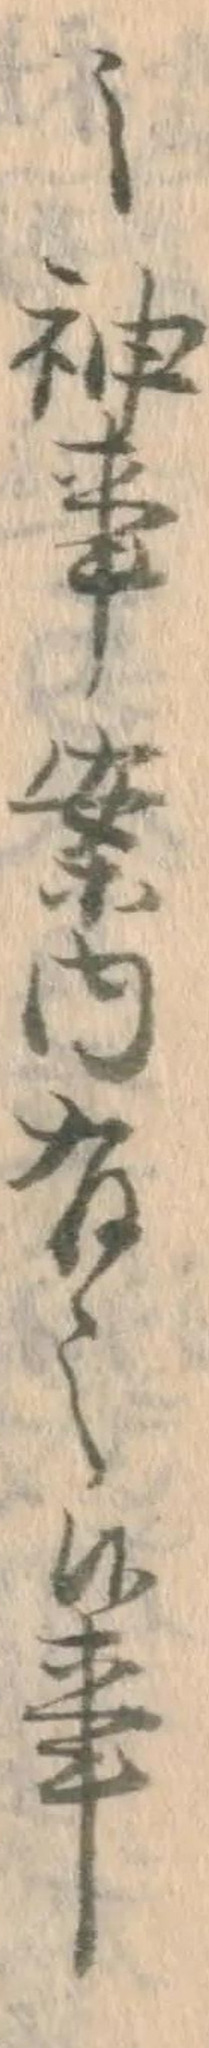之神事案内有之候事
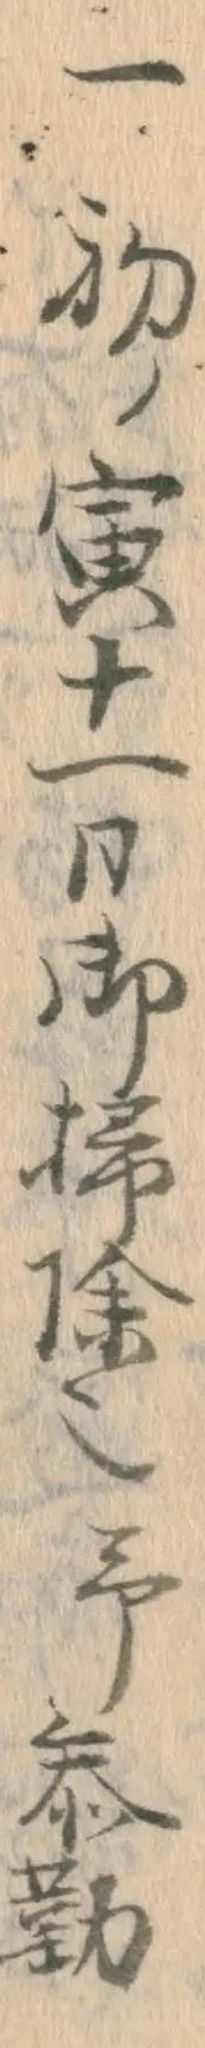一初ノ寅十一日御掃除也予参勤
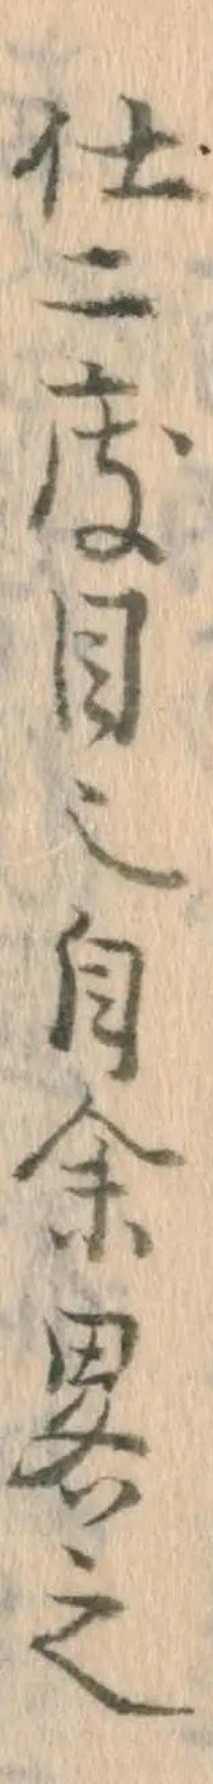仕二度目也自余畧之
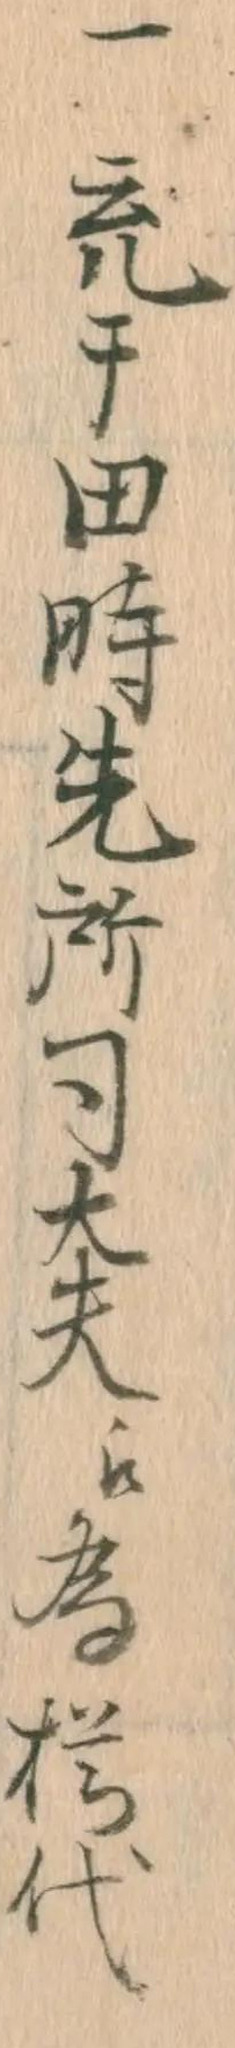一充于田時先所司大夫え為樽代
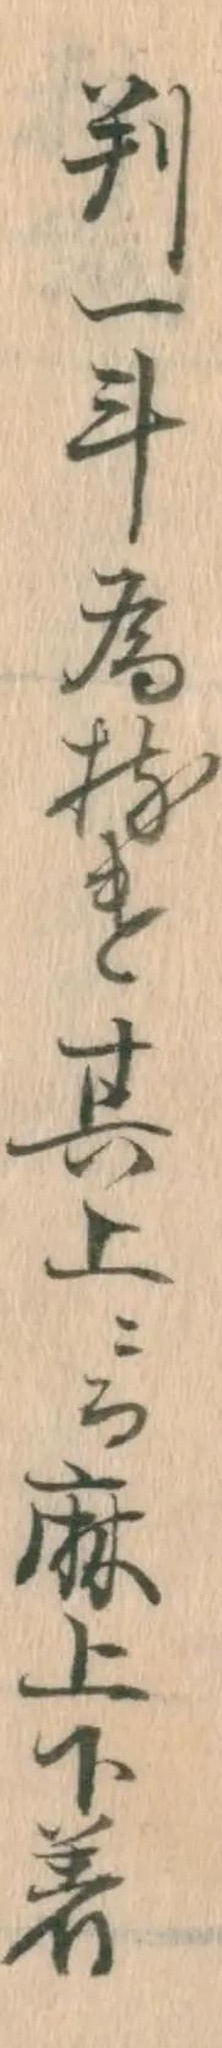判一斗為持遣其上ニ而麻上下着
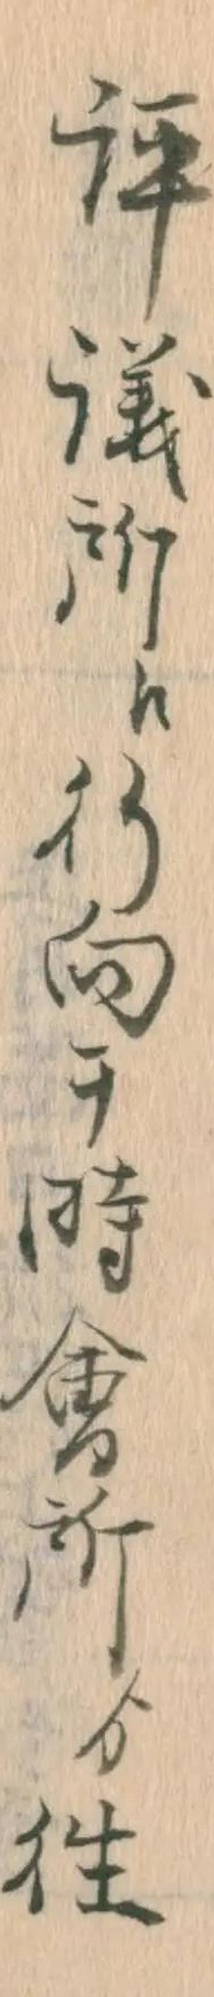評議所え折向于時會所ゟ往
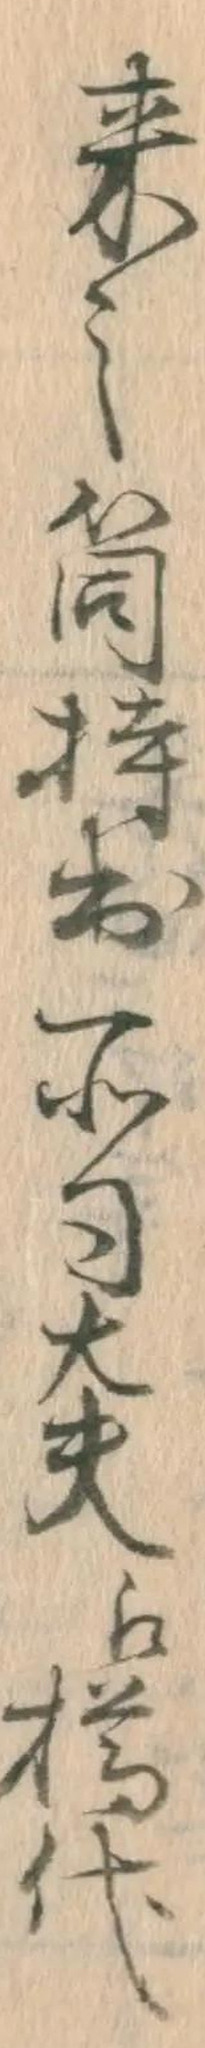来之筒持出所司大夫え樽代
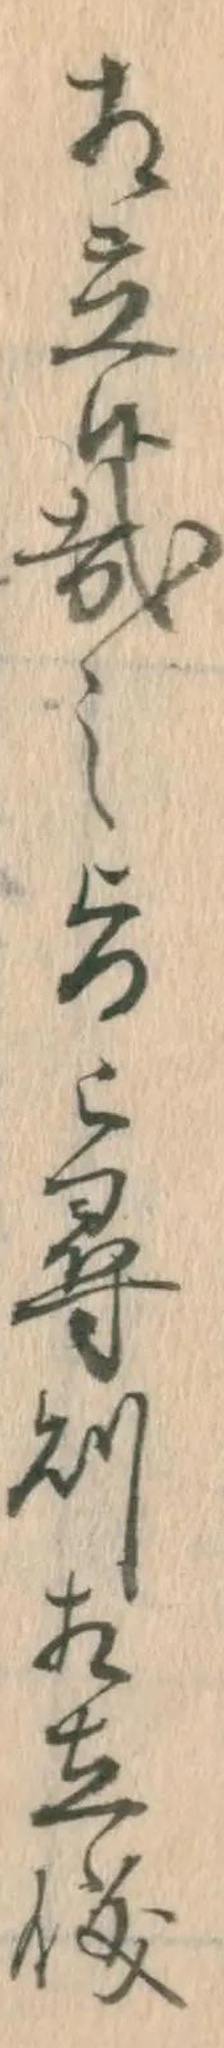相立候哉之旨被尋則相立儀
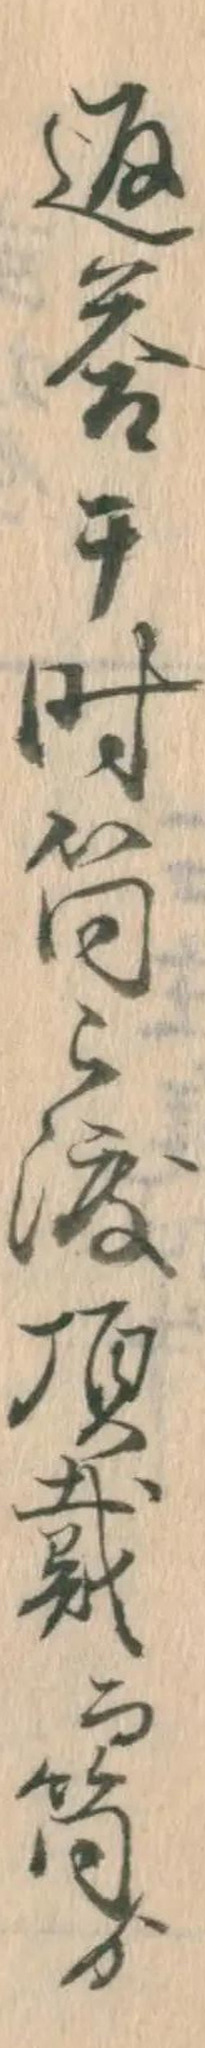返答于時筒被渡頂戴而筒ゟ
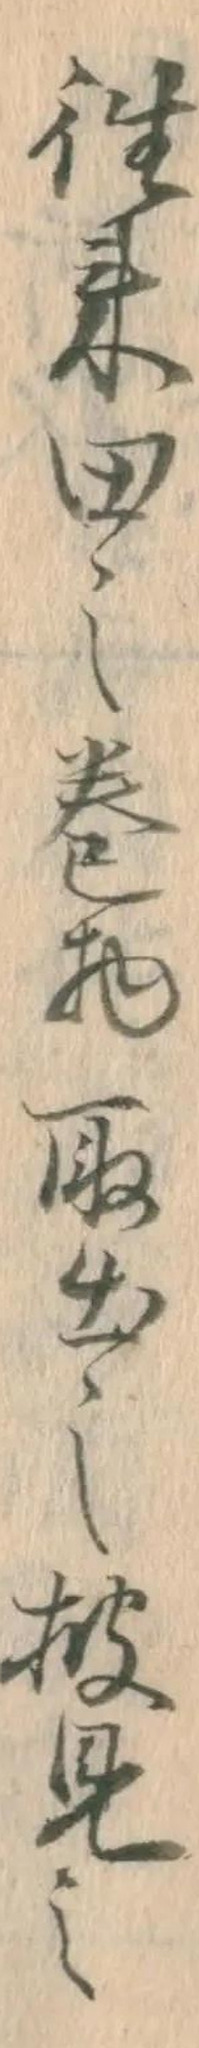往来田之巻物取出也披見之
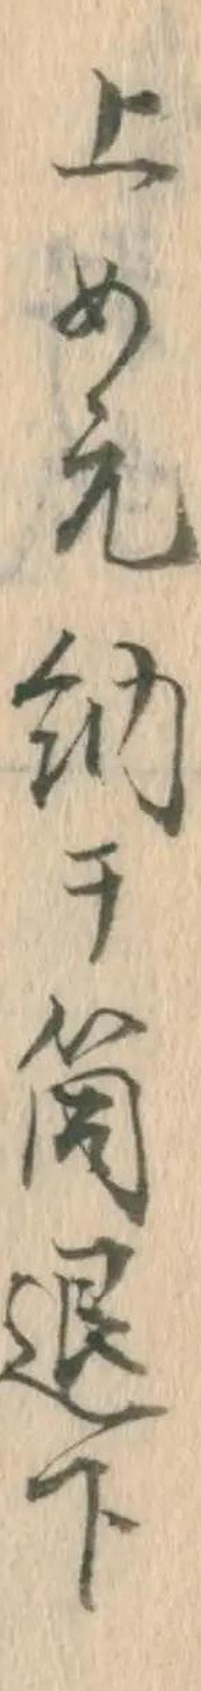上如元納于筒退下
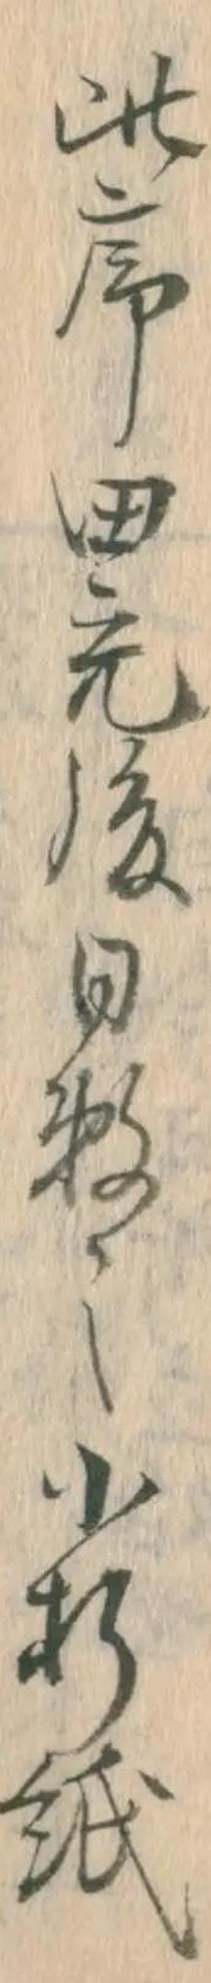此序田充後日数之小折紙
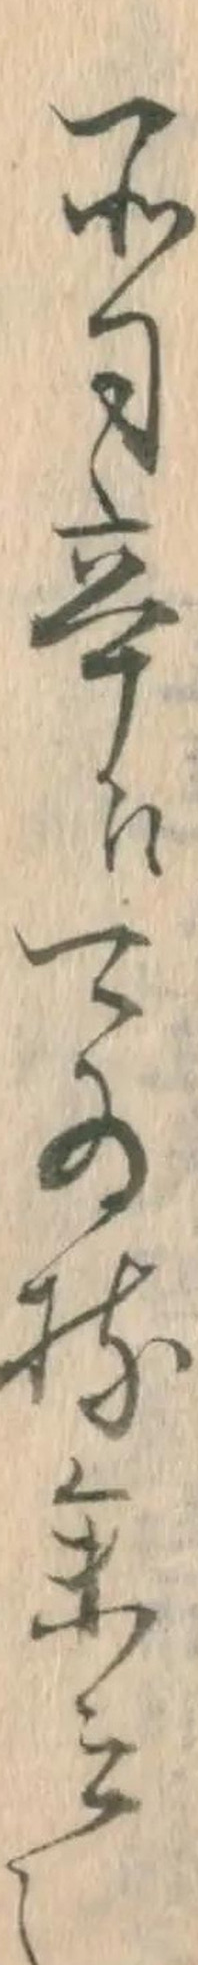所司亭え可為持参云々
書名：賀茂社記録. 第81冊
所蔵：国立国会図書館 National Diet Library, JAPAN
